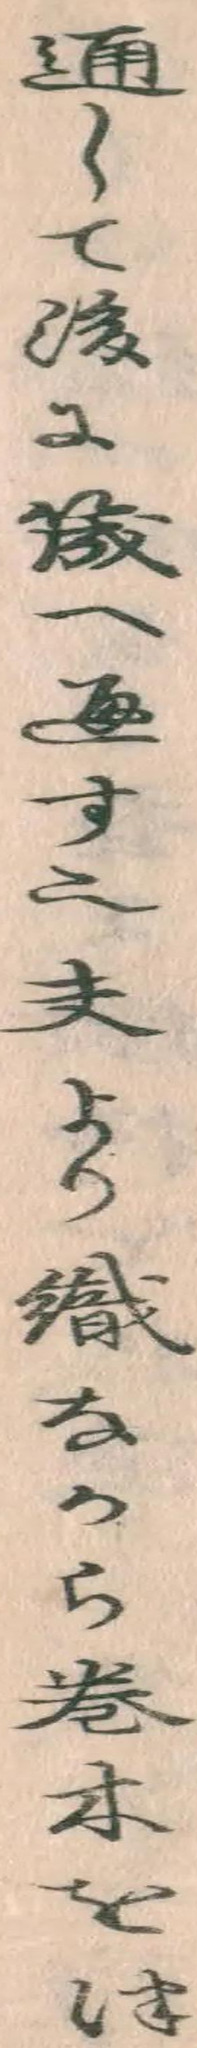通して後に筬へ通す也夫より織なから巻木をつ
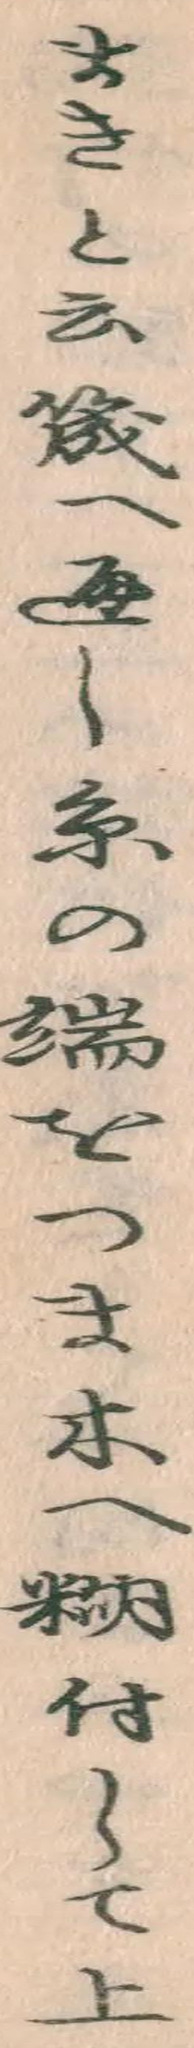まきと云筬へ通し糸の端をつま木へ糊付して上
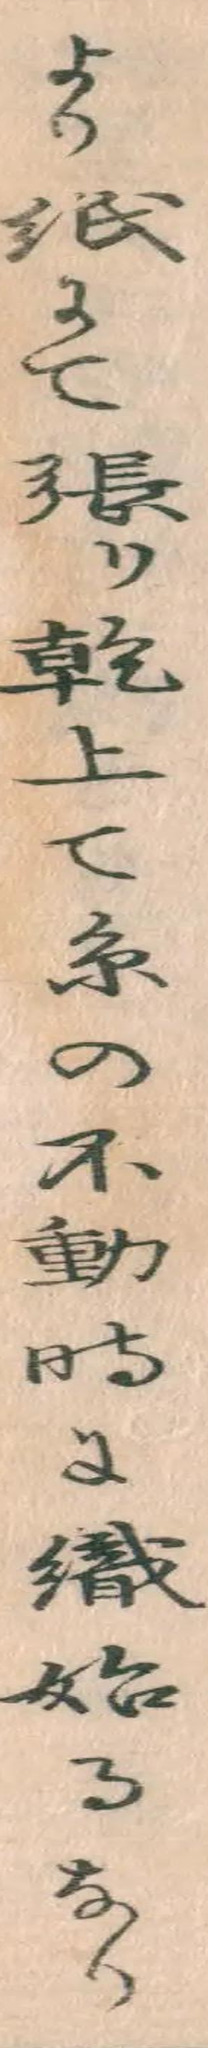より紙にて張り乾上て糸の不動時に織始るなり
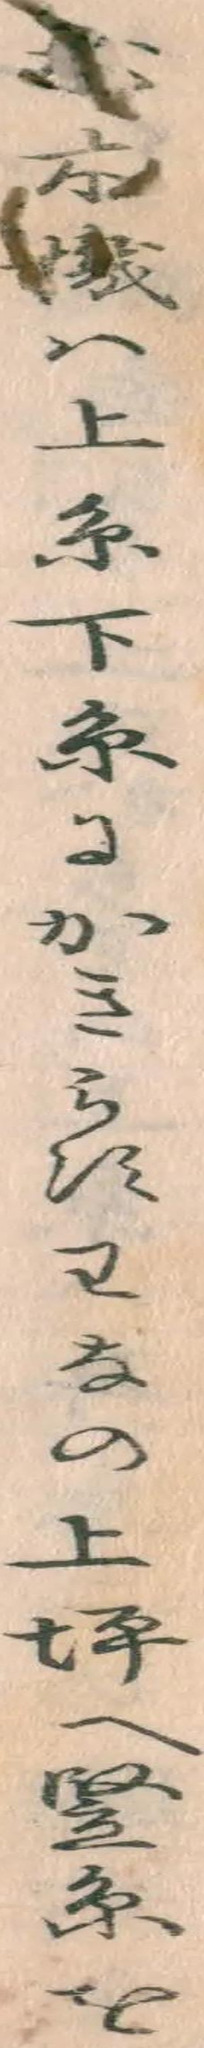尤木機は上糸下糸にかきらすわなの上坪へ竪糸を
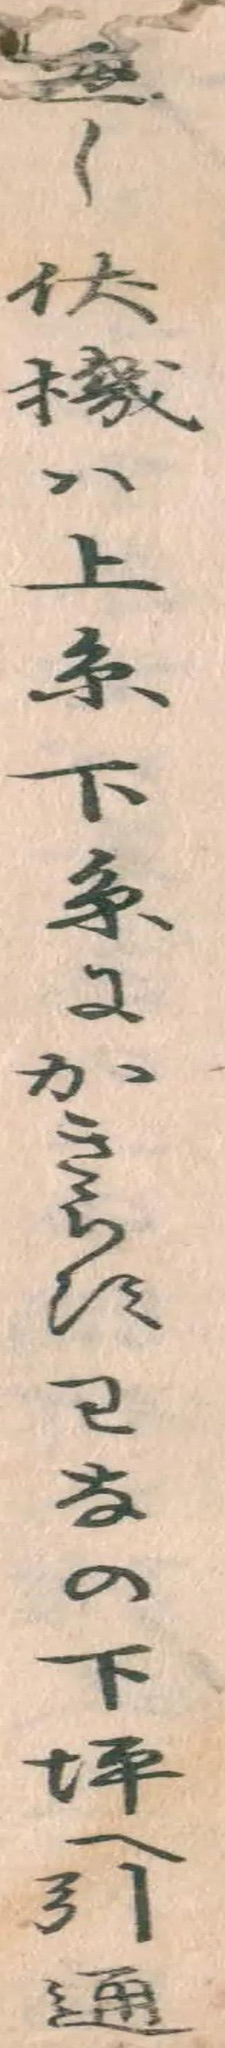通し伏機は上糸下糸にかきらすわなの下坪へ引通
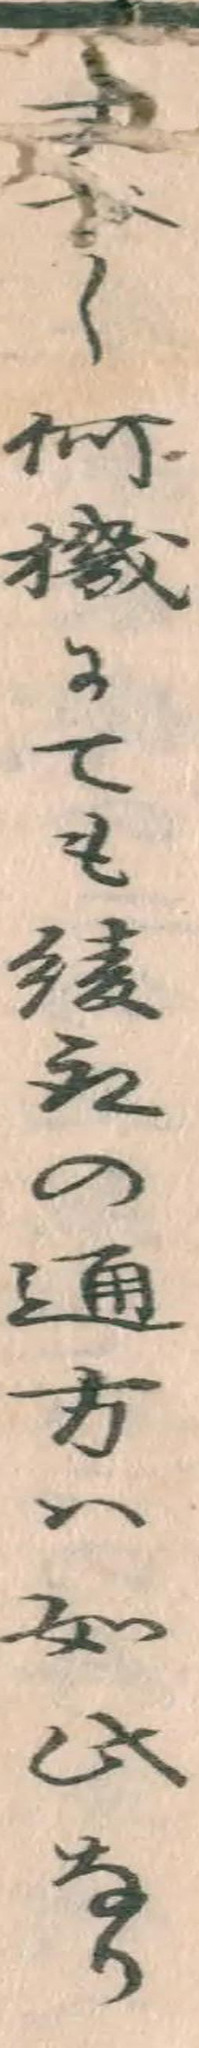すへし何機にても綾取の通方は如此なり
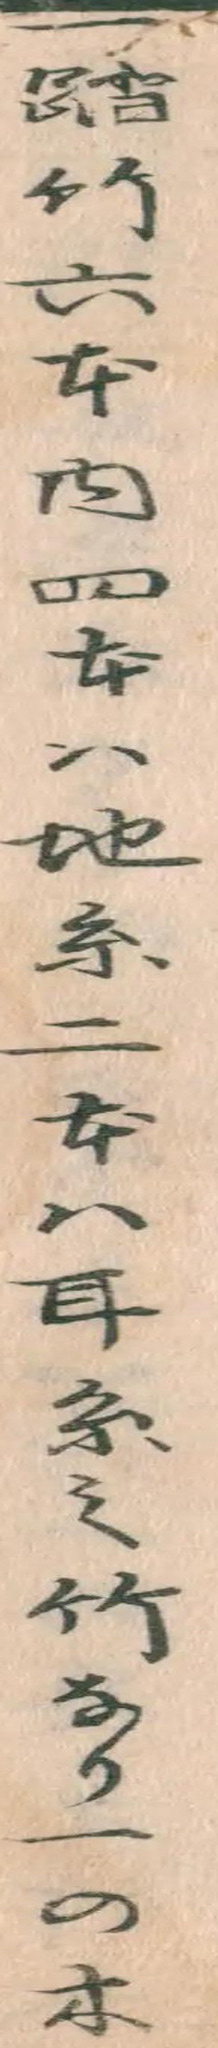一蹈竹六本内四本は地糸二本は耳糸之竹なり一の木
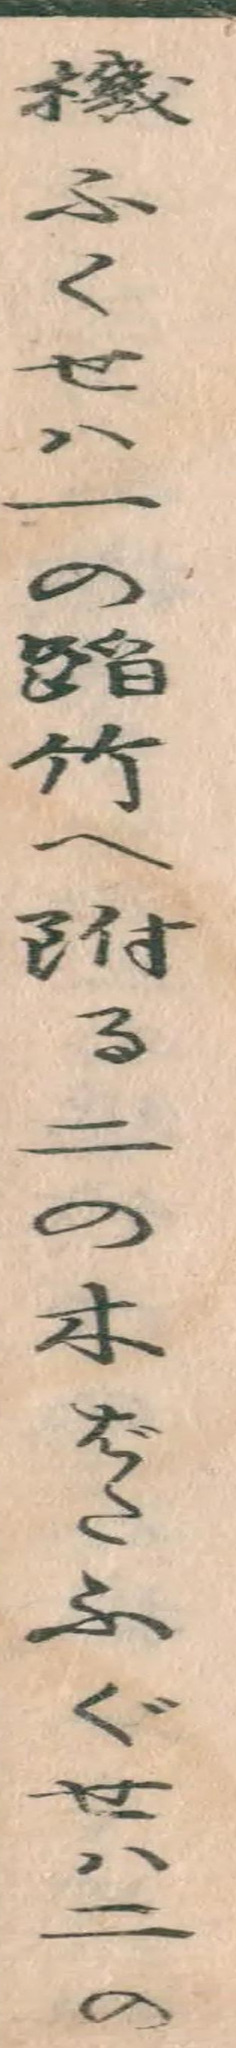機ふくせは一の蹈竹へ附る二の木ばたふぐせは二の

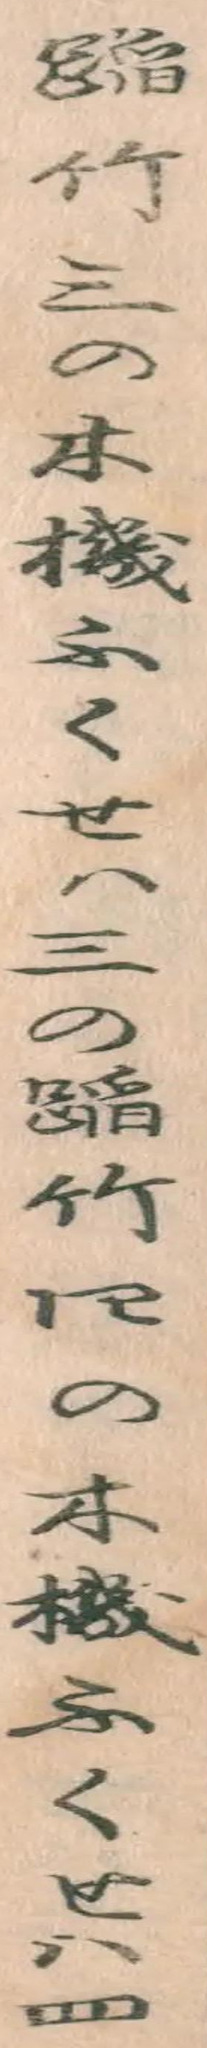蹈竹三の木機ふくせは三の蹈竹四の木機ふくせは四
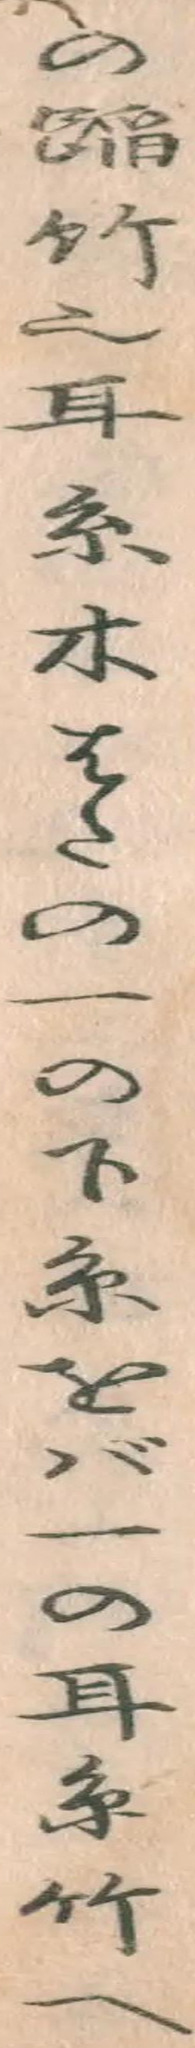の蹈竹也耳糸木はたの一の下糸をば一の耳糸竹へ
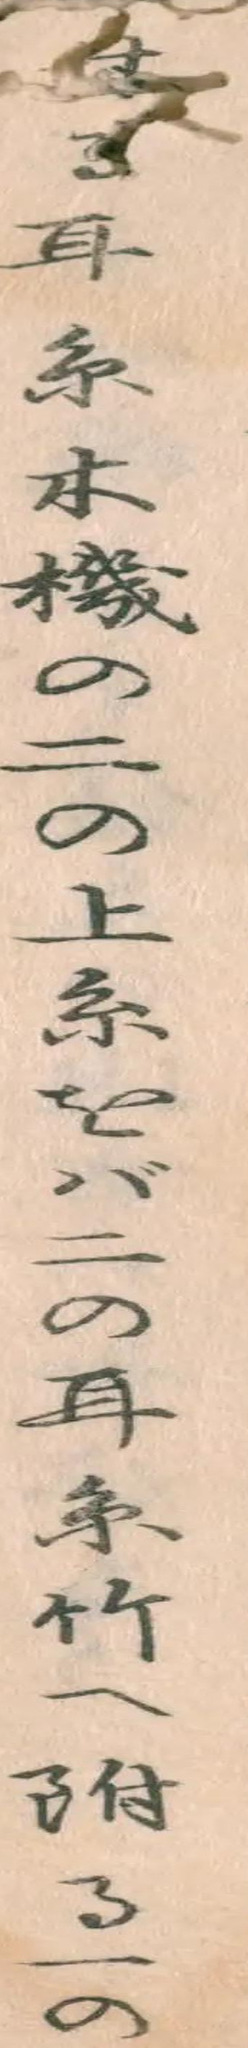付る耳糸木機の二の上糸をば二の耳糸竹へ附る一の
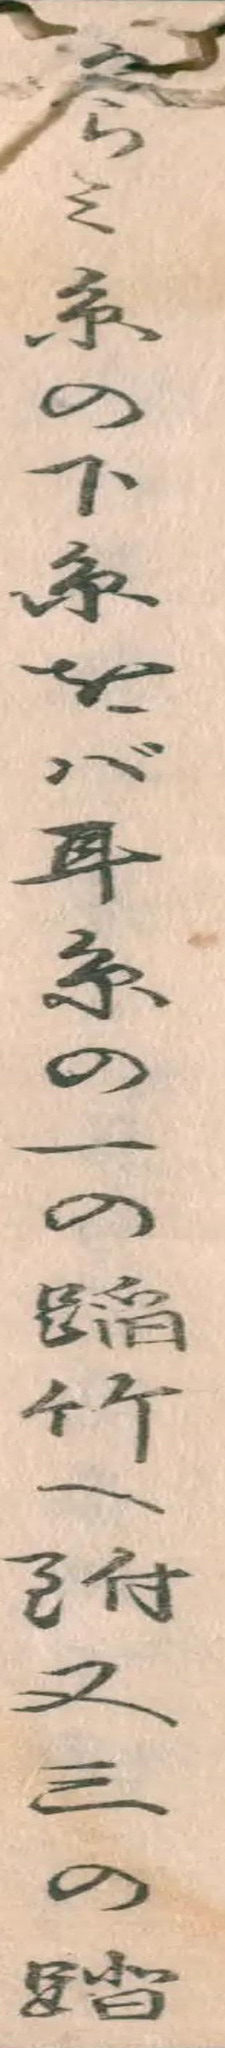からみ糸の下糸をば耳糸の一の蹈竹へ附又三の蹈
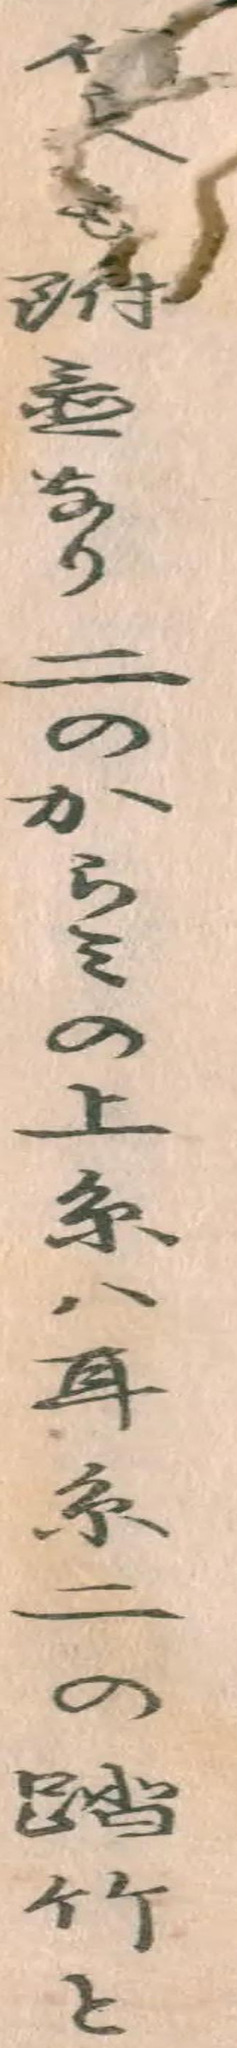竹へも附置なり二のからみの上糸は耳糸二の蹈竹と
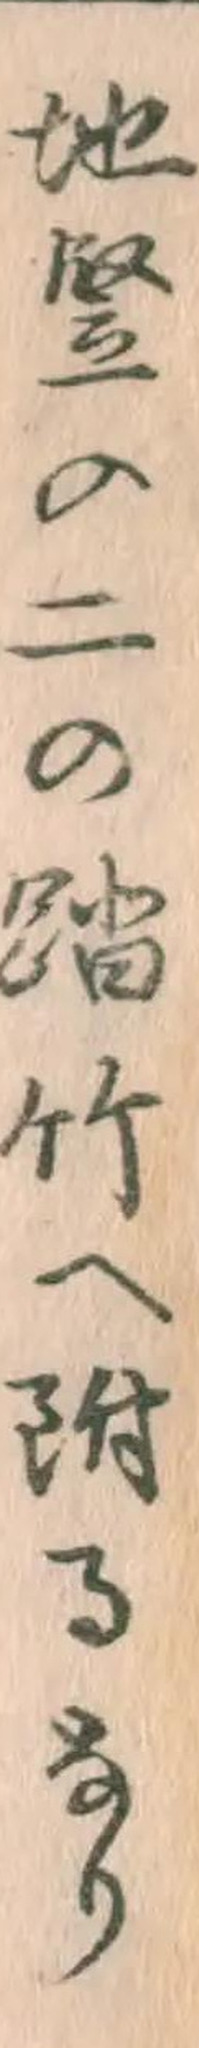地竪の二の蹈竹へ附るなり
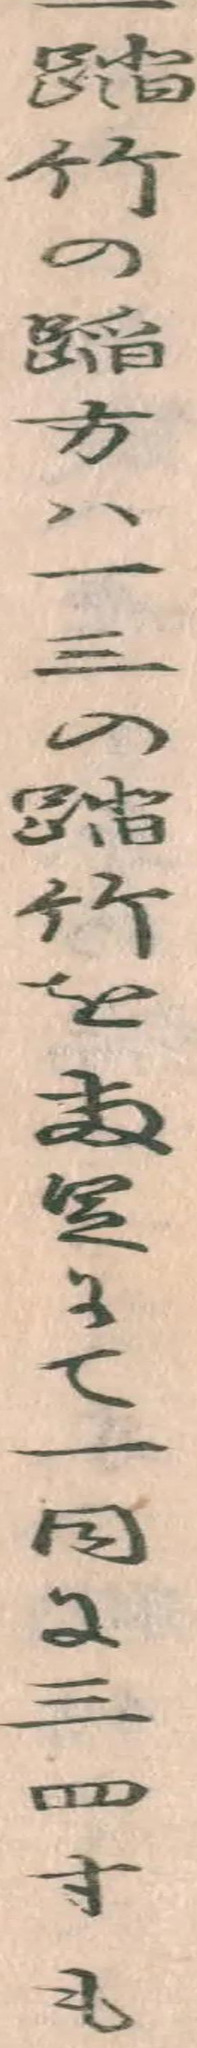一蹈竹の蹈方は一三の蹈竹を両足にて一同に三四寸も
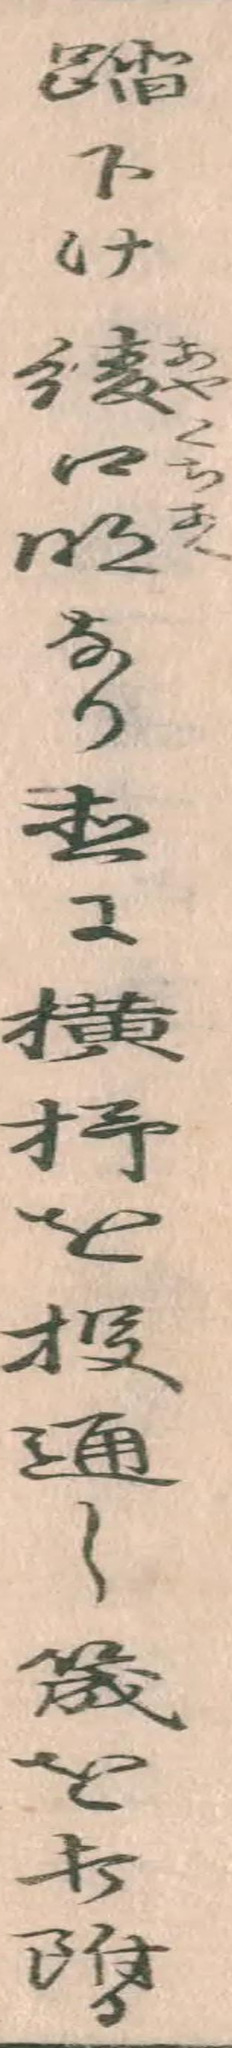蹈下け綾口明なり直に横杼を投通し筬を打附る
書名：機織彙編 5巻. [2]
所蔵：国立国会図書館 National Diet Library, JAPAN
